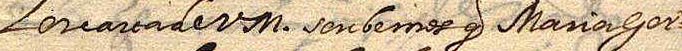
Por carta de V M. soubemos q̄. Maria Gor
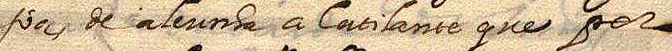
joa, de alcunha a Cutilante que por
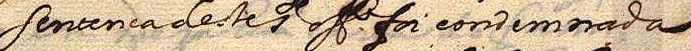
sentença deste sto offo foi condemnada
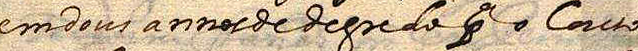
em dous annos de degredo pa o Couto
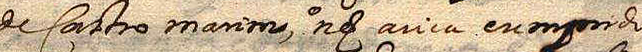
de Castro marim, o naõ auia cumprido
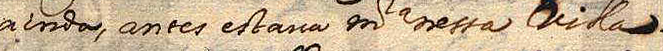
ainda, antes estaua mra nessa Villa:
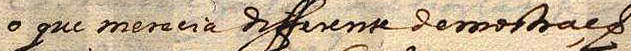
o que merecia differente demostraçaõ
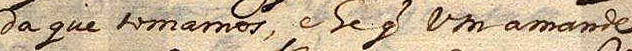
da que tomamos, e he q̄ Vm a mande
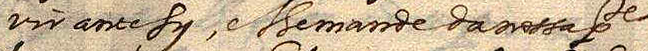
vir ante sy, e lhe mande da nossa pte
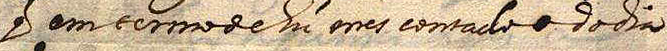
q̄ em termo de hū mes contado o do dia
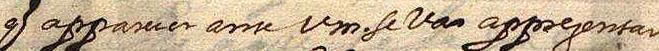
q̄ apparecer ante vm se va apprezentar
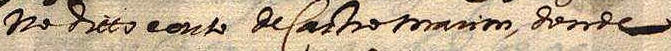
no dito couto de Castro marim, donde
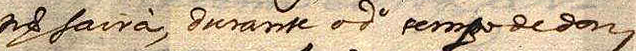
naõ sairà, durante o do tempo de dous
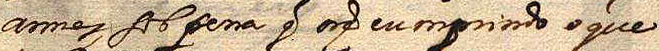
annos, sob pena q̄ naõ cumprindo o que
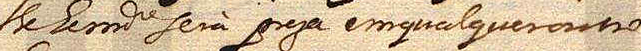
lhe he mdo serà preza em qualquer outro
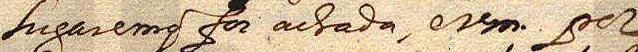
lugar em q̄ foi achada, e vm. por
